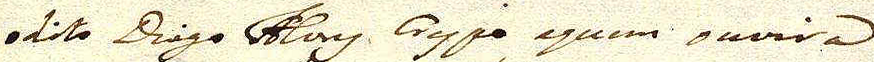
o dito Diogo Alvres Crespo, a quem ouvira
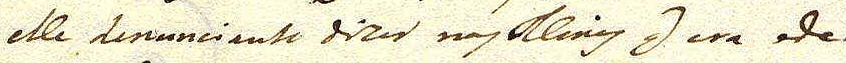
elle denunciante dizer nas Minas q̄ era o de
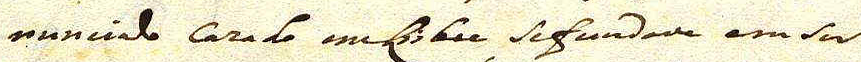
nunciado cazado em Lisboa, se fundava em ser
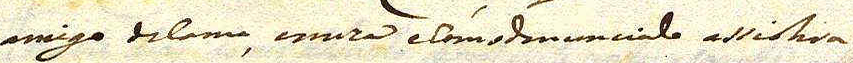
amigo de cama, e meza e com o denunciado assistira
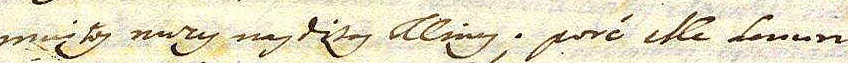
muitos mezes nas dita Minas; porē elle denun
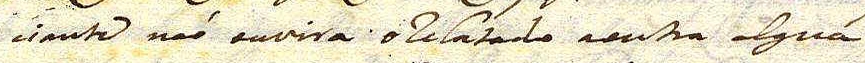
ciante naõ ouvira o Relatado a outra alguā
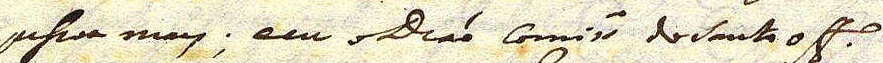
pessoa mais; e eu o Deaõ comisso do Santo off.o
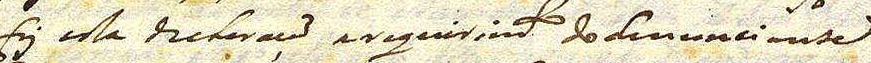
fis esta declaraçaõ a requirimto do denunciante
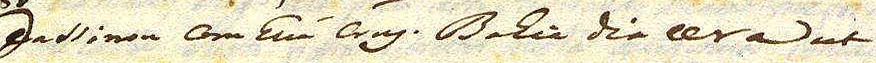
q̄ assinou com huā crus. Bahia dia e era ut
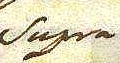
Supra
